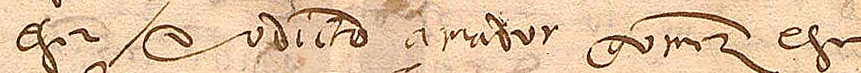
lher / e o dīcto amador gōmez lhe
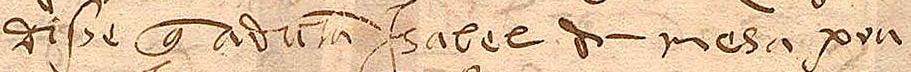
disse q̄ a dic̄ta Jsabel de mesa pou
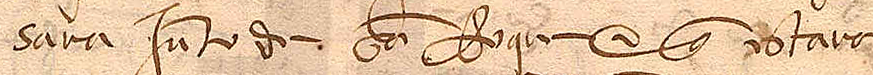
saua Jūto de sā Roque e q̄ estaua
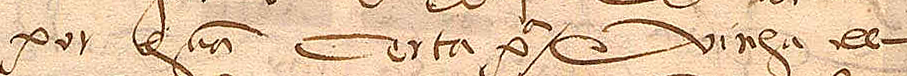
por hūa Certa pa / e vinha elle
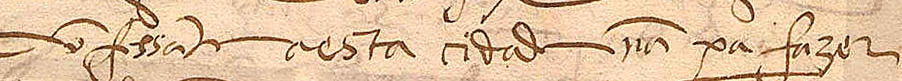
cōfessāte a esta cidade nā ꝑa fazer
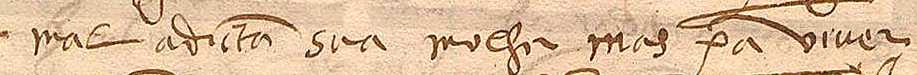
mal a dic̄ta sua molher mas ꝑa viuer
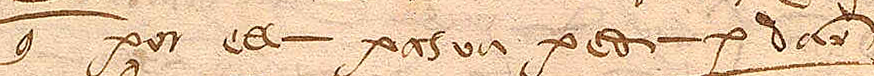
q̄ por elle pasou pede ꝑdão
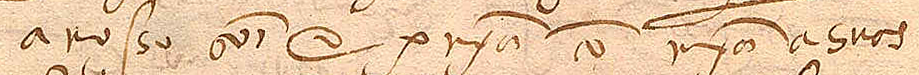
a nosso sōr e pnȳa cō mȳa a suas
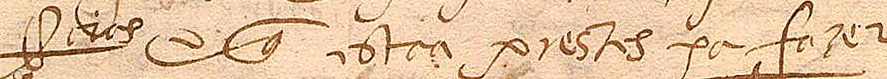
Rcias e q̄ estaa prestes ꝑa fazer
